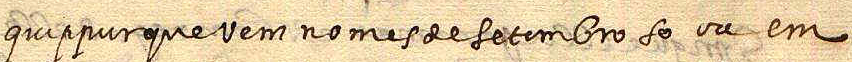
quippur que vem no mes de setembro so ou em
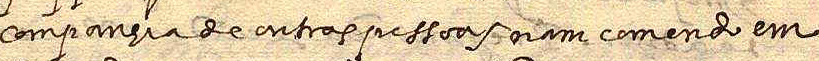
companhia de outras pessoas nam comendo em
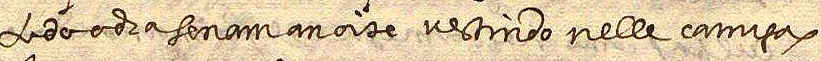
todo o dia senam a noite uestindo nelle camisas
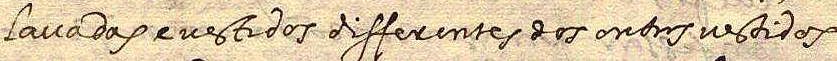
Lauadas e uestidos differentes dos outros uestidos
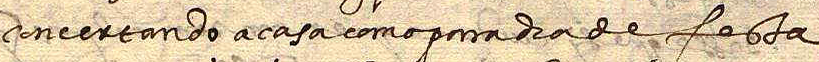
concertando a casa como para dia de festa
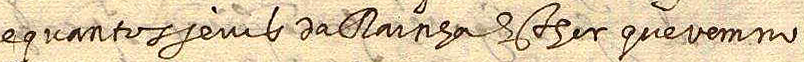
e quantos jeiūs da Rainha Esther que vem no
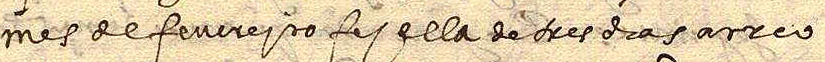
mes de feuereiro fez ella de tres dias a rreo
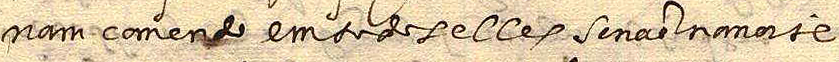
nam comendo em todos elles senaõ na noite
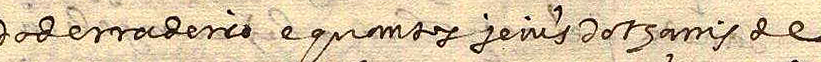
do derradeiro e quantos jeiūs do thanis de
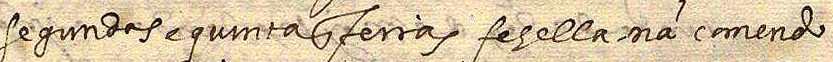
segundas e quintas feiras fez ella nã comendo
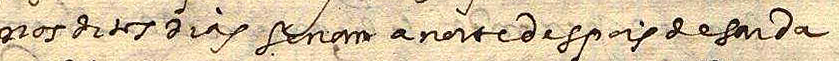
nos ditos dias senam a noite despois de saida
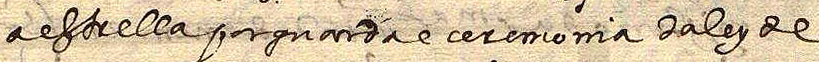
a estrella por guarda e ceremonia da ley de
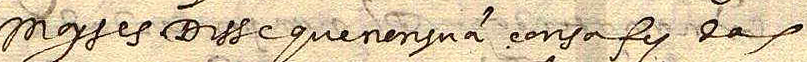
Moyses. Disse que nenhuā cousa fez das
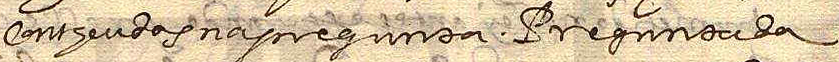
contheudas na pregunta. Preguntada
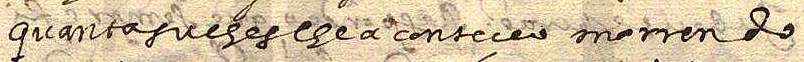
quantas ueses lhe aconteçeo morrendo
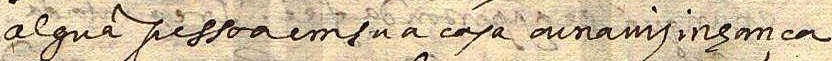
alguā pessoa em sua casa ou na uisinhança
